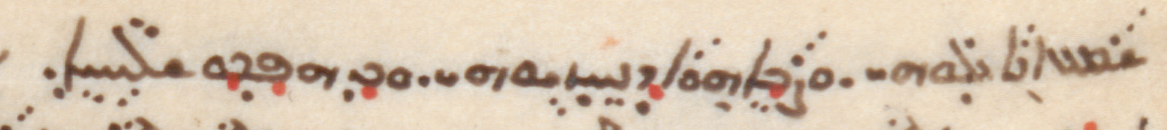ܫ̇ܡܥ ܬܢܐ ܥܠܘܗܝ. ܘܨ̇ܒܐ ܗܘܐ ܕܢܚܙܝܘܗܝ. ܘܟܕ ܗܦܟܘ ܫܠܝ̈ܚܐ܆
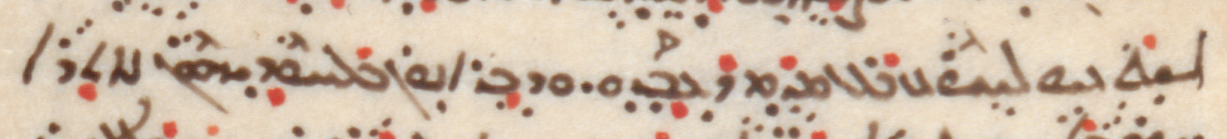ܐܫ̣ܬܥܝܘ ܠܝܫܘܥ ܟܠ ܡܕܡ ܕܥܒ̣ܕܘ. ܘܕܒ̣ܪ ܐܢܘܢ ܒܠܚܘܕܝܗܘܢ ܠܐܬܪܐ
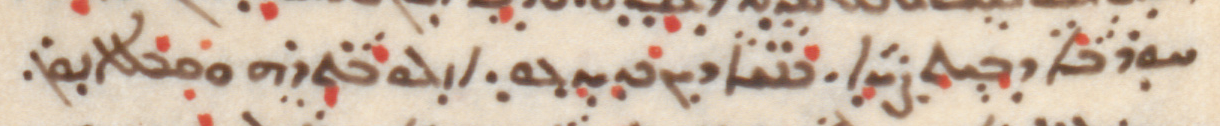ܚܘܪܒܐ ܕܒܝܬ ܨܝܕܐ. ܟܢ̈ܫܐ ܕܝܢ ܟܕ ܝܕܥܘ܆ ܐܙ̣ܠܘ ܒܬܪܗ ܘܩܒܠ ܐܢܘܢ܇
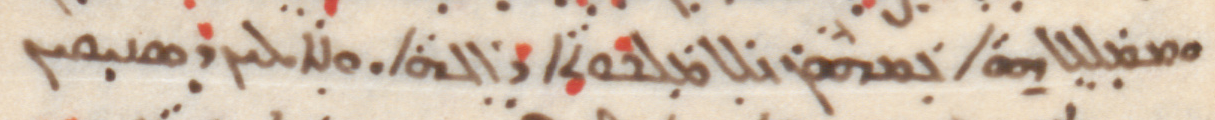ܘܡܡ̣ܠܠ ܗܘܐ ܥܡܗܘܢ ܥܠ ܡܠܟܘܬܐ ܕܐܠܗܐ. ܘܠܐܝܠܝܢ ܕܣܢܝܩܝܢ
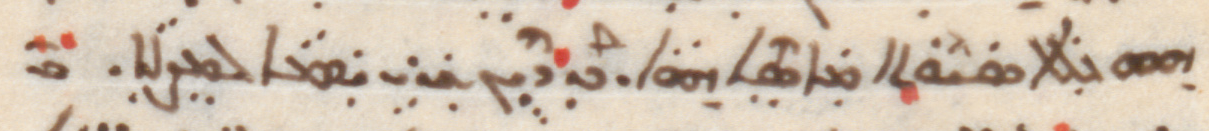ܗܘܘ ܥܠ ܐܣܝܘܬܐ ܡܐܣܐ ܗܘܐ. ܟܕ ܕܝܢ ܫܪܝ ܝܘܡܐ ܠܡܨܠܐ. ܏ܩ
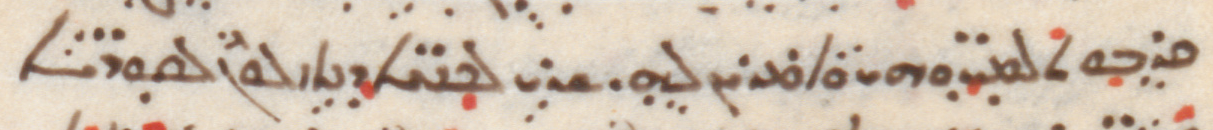ܩܪܒܘ ܬܠܡܝ̈ܕܘܗܝ ܘܐܡ̇ܪܝܢ ܠܗ. ܫܪܝ ܠܟܢ̈ܫܐ ܕܢܐܙܠܘܢ ܠܩܘܪ̈ܝܐ
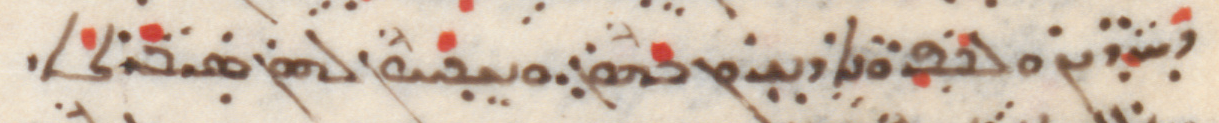ܕܚܕܪܝܢ ܘܠܟܦܪ̈ܘܢܐ ܕܢܫܪܘܢ ܒܗܘܢ܆ ܘܢܫܟܚܘܢ ܠܗܘܢ ܣܝܒܪܬܐ.
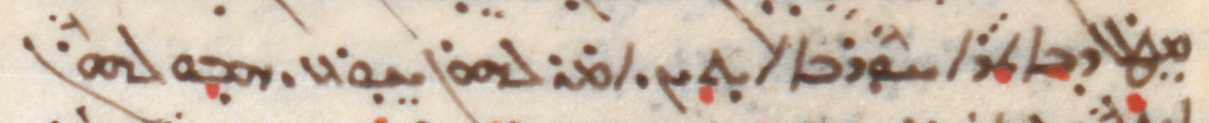ܡܛܠ ܕܒܐܬܪܐ ܚܘܪܒܐ ܐܝܬܝܢ. ܐܡ̇ܪ ܠܗܘܢ ܝܫܘܥ. ܗܒܘ ܠܗܘܢ
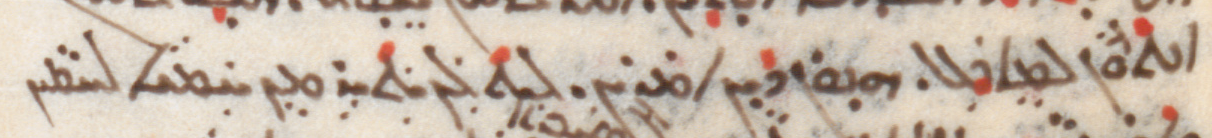ܐܢܬܘܢ ܠܡܐܟܠ. ܗ̣ܢܘܢ ܕܝܢ ܐܡ̇ܪܝܢ. ܠܝܬ ܠܢ ܝܬܝܪ ܡ̣ܢ ܚܡܫܐ ܠܚܡ̈ܝܢ
